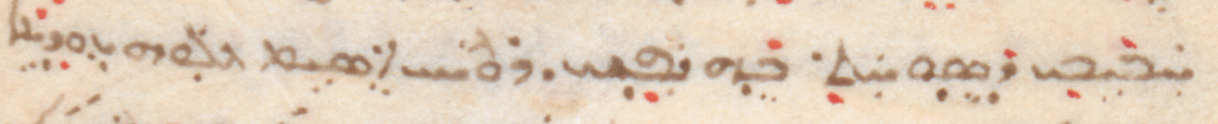ܚܒܝܒܝ ܕܣܘܚܬ ܒܗ ܢܦܫܝ. ܪܘܚܝ ܐܣܝܡ ܥܠܘܗܝ ܘܕܝܢܐ
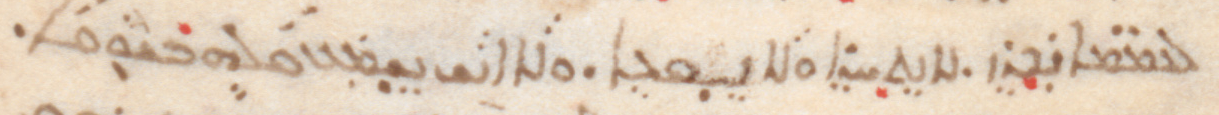ܠܥܡ̈ܡܐ ܢܟܪܙ. ܠܐ ܢܬܚܪܐ ܘܠܐ ܢܩܥܐ. ܘܠܐ ܐܢܫ ܢܫܡܥ ܩܠܗ ܒܫܘܩܐ.
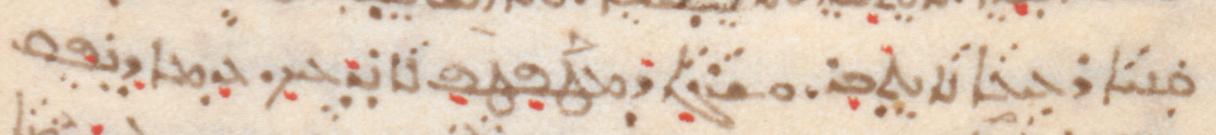ܩܢܝܐ ܪܥܝܥܐ ܠܐ ܢܬܒܪ. ܘܫܪܓܐ ܕܡܛܦܛܦ ܠܐ ܢܕܥܟ. ܥܕܡܐ ܕܢܦܩ
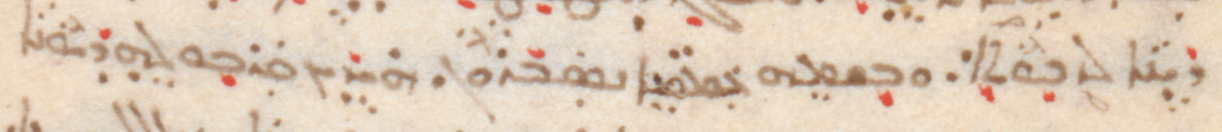ܕܝܢܐ ܠܙܟܘܬܐ: ܘܒܫܡܗ ܥܡ̈ܡܐ ܢܣܒܪܘܢ. ܗܝܕܝܢ ܩܪܒܘ ܠܗ ܕܝܘܢܐ
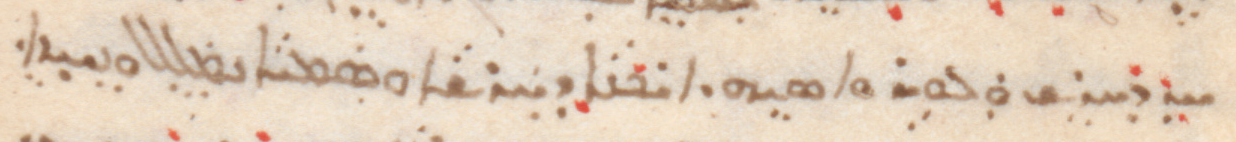ܚܕ ܕܚܪܫ ܘܥܘܝܪ ܘܐܣܝܗ. ܐܝܟܢܐ ܕܚܪܫܐ ܘܣܡܝܐ ܢܡܠܠ ܘܢܚ̣ܙܐ.
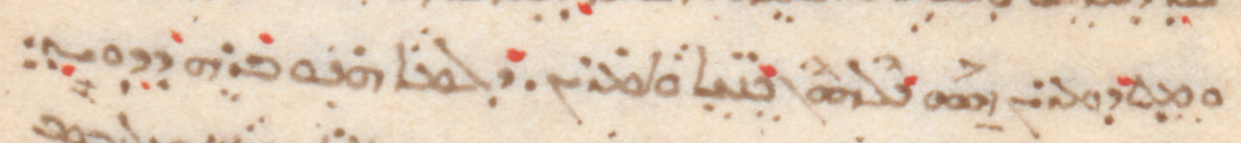ܘܡܬܕܡܪܝܢ ܗܘܘ ܟܠܗܘܢ ܟܢ̈ܫܐ ܘܐܡ̇ܪܝܢ. ܕܠܡܐ ܗ̇ܢܘ ܒܪܗ ܕܕܘܝܕ:
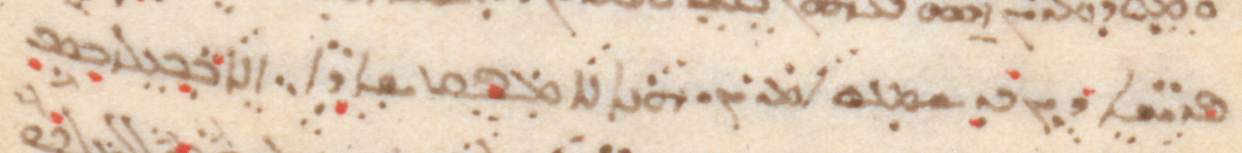ܦܪ̈ܝܫܐ ܕܝܢ ܟܕ ܫܡ̣ܥܘ ܐܡ̇ܪܝܢ. ܗܢܐ ܠܐ ܡ̇ܦܩ ܫܐ̈ܕܐ: ܐܠܐ ܒܒܥܠܙܒܘܒ
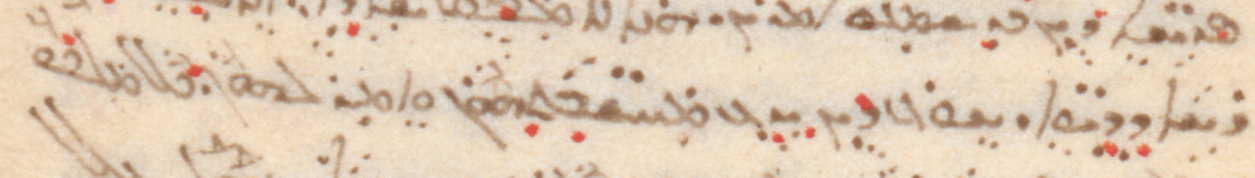ܪܝܫܐ ܕܕܝ̈ܘܐ. ܝܫܘܥ ܕܝܢ ܝܕܥ ܡܚܫ̈ܒܬܗܘܢ ܘܐܡ̣ܪ ܠܗܘܢ. ܟܠ ܡܠܟܘ
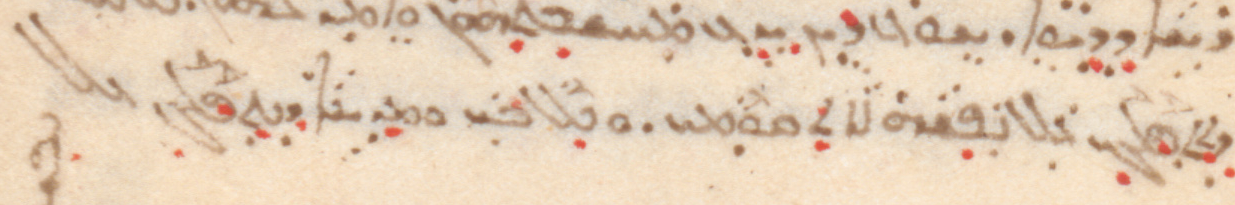ܕܬܬ ܦܠܓܝ ܥܠ ܢܦܫܗ̇ ܠܐ ܬܩܘܡܝ. ܘܟܠ ܒܝ ܘܡܕܝܢܐ ܕܢܬܦܠܓ ܥܠ
